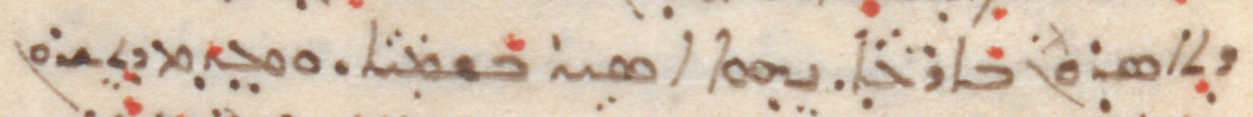ܕܬܐܣܪܘܢ ܒܐܪܥܐ܆ ܢܗܘܐ ܐܣܝܪ ܒܫܡܝܐ. ܘܡܕܡ ܕܬܫܪܘܢ
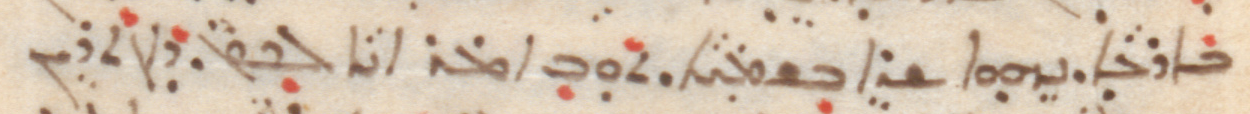ܒܐܪܥܐ. ܢܗܘ̣ܐ ܫܪܐ ܒܫܡܝܐ. ܬܘܒ ܐܡ̇ܪ ܐܢܐ ܠܟܘܢ. ܕܐܢ ܬܪܝܢ
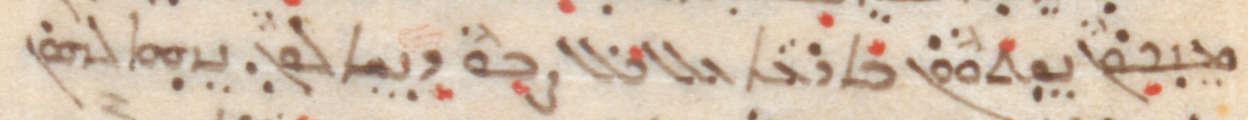ܡܢܟܘܢ ܢܫܬܘܘܢ ܒܐܪܥܐ ܥܠ ܟܠ ܨܒܘ ܕܢܫܐ ܠܘܢ܆ ܢܗܘܐ ܠܗܘܢ
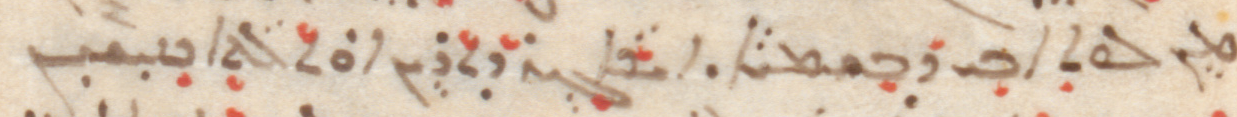ܡܢ ܠܘܬ ܐܒܝ ܕܒܫܡܝܐ. ܐܝܟܐܓܝܪ ܕܬܪܝܢ ܐܘܬ ܠܬܐ ܟܢܝܫܝܢ
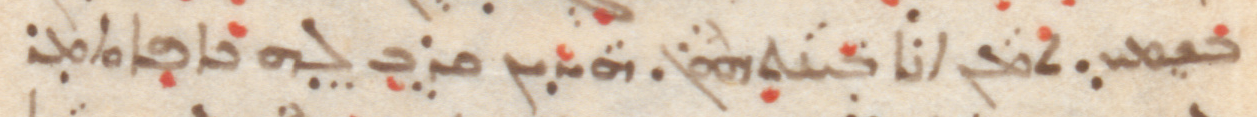ܒܫܡܝ܆ ܬܡܢ ܐܢܐ ܒܝܢܬܗܘܢ. ܗܝܕܝܢ ܩܪܒ ܠܗ ܟܐܦܐ ܘܐܡ̣ܪ
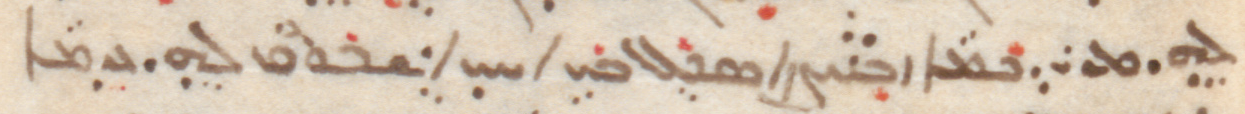ܠܗ. ܡܪܝ ܟܡܐ ܙܒܢ̈ܝܢ ܐܣܟܠ ܒܝ ܐܚܝ ܐܫܒܘܩ ܠܗ܆ ܥܕܡܐ
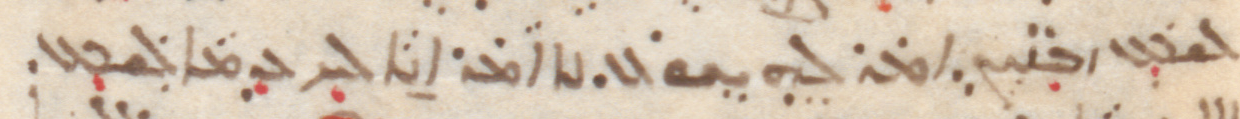ܠܫܒܥ ܙܒܢ̈ܝܢ܆ ܐܡ̇ܪ ܠܗ ܝܫܘܥ. ܠܐ ܐܡܪ ܐܢܐ ܠܟ ܥܕܡܐ ܠܫܒܥ:
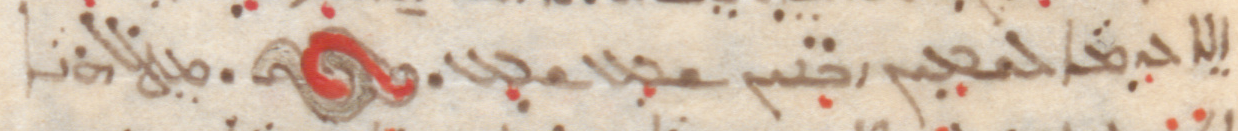ܐܠܐ ܥܕܡܐ ܠܫܒܥܝܢ ܙܒ̈ܢܝܢ ܫܒܥ ܫܒܥ ܀ ܡܛܠ ܗܢܐ
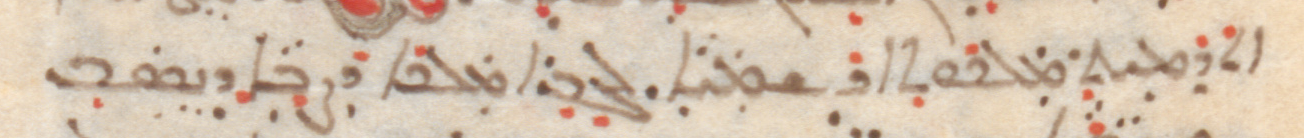ܐܬܕܡܝܬ݀ ܡܠܟܘܬܐ ܕܫܡܝܐ. ܠܓܒܪܐ ܡܠܟܐ ܕܨܒܐ ܕܢܣܒ
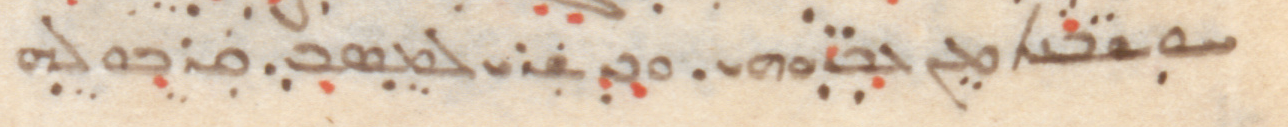ܚܘܫܒܢܐ ܡܢ ܥܒ̈ܕܘܗܝ. ܘܟܕ ܫܪܝ ܠܡܣܒ܆ ܩܪܒܘ ܠܗ
